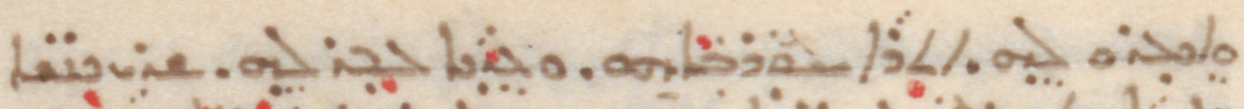ܘܐܡ̣ܪܘ ܠܗ. ܐܬܪܐ ܚܘܪܒܐ ܗܘ. ܘܥܕܢܐ ܥܒ̣ܪ ܠܗ. ܫܪܝ ܟܢ̈ܫܐ
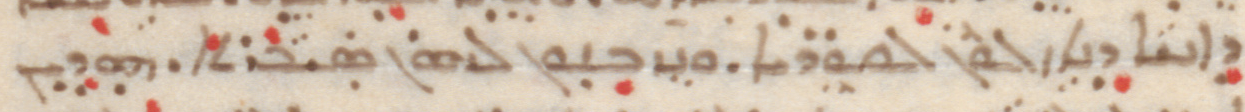ܕܐܢܫܐ ܕܢܐܙܠܘܢ ܠܩܘܪ̈ܝܐ. ܘܢܙܒܢܘܢ ܠܗܘܢ ܣܝܒܪܬܐ. ܗ̣ܘ ܕܝܢ
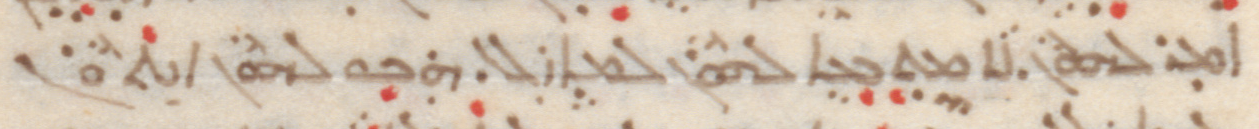ܐܡ̣ܪ ܠܗܘܢ. ܠܐ ܡܬܒܥܐ ܠܗܘܢ ܠܡܐܙܠ. ܗܒܘ ܠܗܘܢ ܐܢܬܘܢ
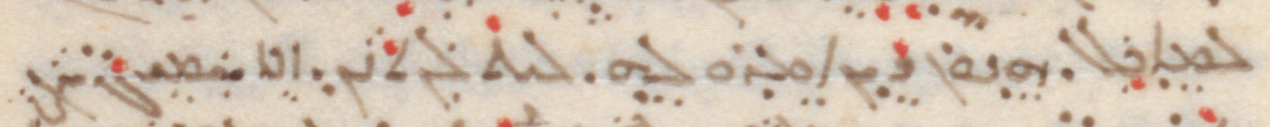ܠܡܐܟܠ. ܗܢܘܢ ܕܝܢ ܐܡ̣ܪܘ ܠܗ. ܠܝܬ ܠܢ ܬܢܢ܆ ܐܠܐ ܚܡܫ ܓܪ̈ܨܢ
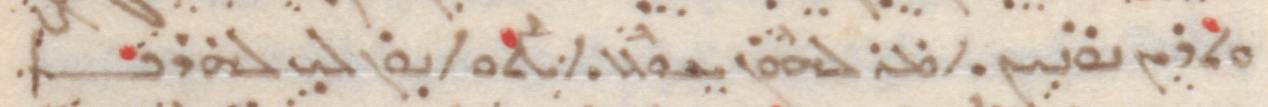ܘܬܪ̈ܝܢ ܢܘ̈ܢܝܢ. ܐܡ̇ܪ ܠܗܘܢ ܝܫܘܥ. ܐܝܬܘ ܐܢܘܢ ܠܝ ܠܗܪܟܐ.
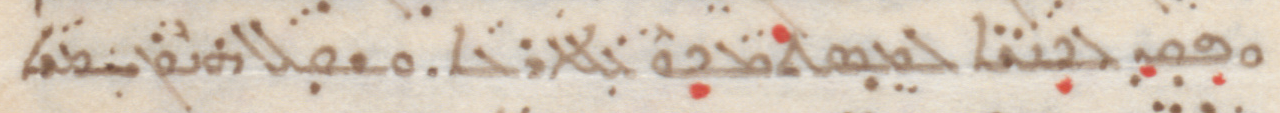ܘܦܩ̣ܕ ܠܟܢܫ̈ܐ ܠܡܣܬܡܟܘ ܥܠ ܐܪܥܐ. ܘܫܩ̣ܠ ܗܢܘܢ ܚܡܫܐ
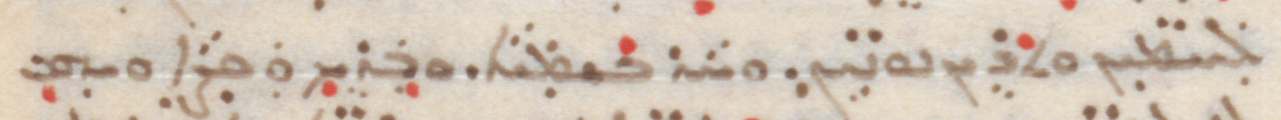ܠܚܡ̈ܝܢ ܘܬܪ̈ܝܢ ܢܘܢ̈ܝܢ܆ ܘܚܪ ܒܫܡܝܐ. ܘܒܪܟ ܘܩܨܐ ܘܝܗܒ
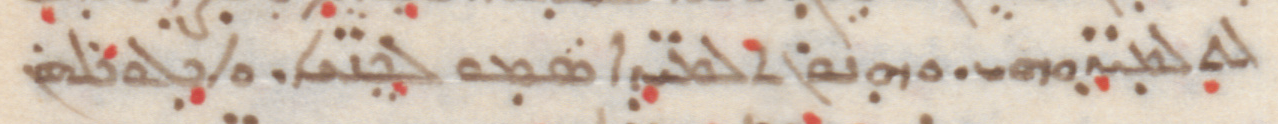ܠܬܠܡܝ̈ܕܘܗܝ. ܘܗ̣ܢܘܢ ܬܠܡܝ̈ܕܐ ܣܡ̣ܘ ܠܟܢ̈ܫܐ. ܘܐܟ̣ܠܘ ܟܠܗܘܢ
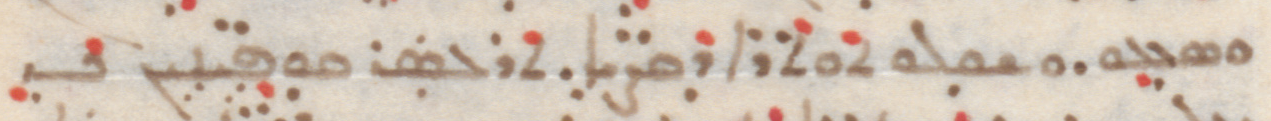ܘܣܒ̣ܥܘ. ܘܫܩ̣ܠܘ ܬܘܬܪ̈ܐ ܕܩܨ̈ܝܐ: ܬܪܥܣܪ ܩܘܦ̈ܝܢܝܢ ܟܕ
